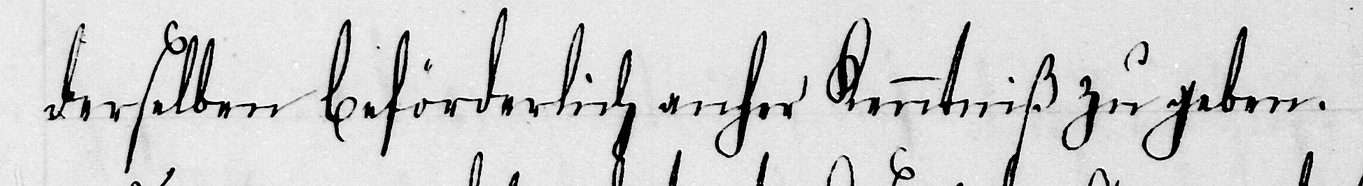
derselben beförderlich anher Kenntniß zu geben.
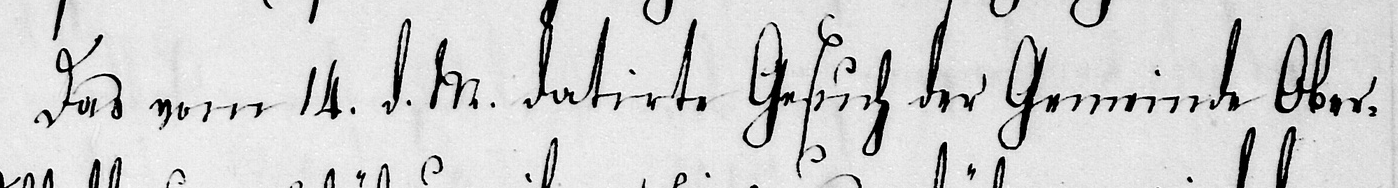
Das vom 14. d. M. datirte Gesuch der Gemeinde Obe¬
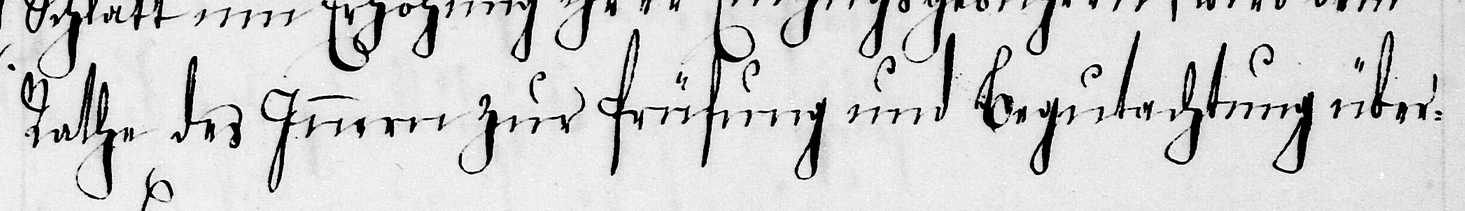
Rathe des Innern zur Prüfung und Begutachtung über¬
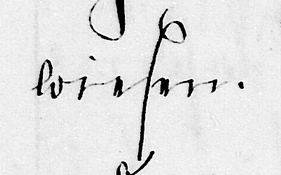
wiesen.
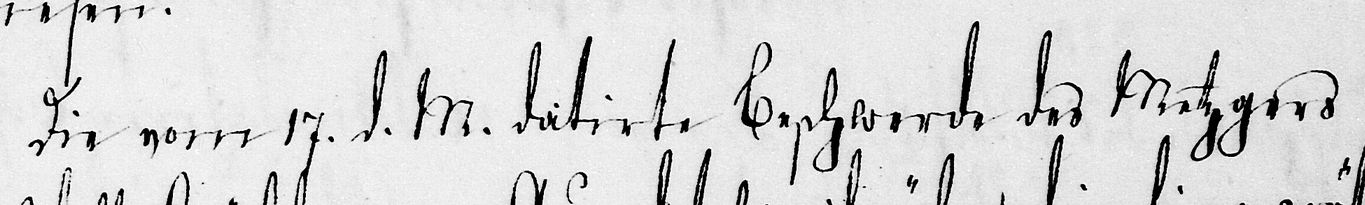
Die vom 17. d. M. datirte Beschwerde des Metzgers
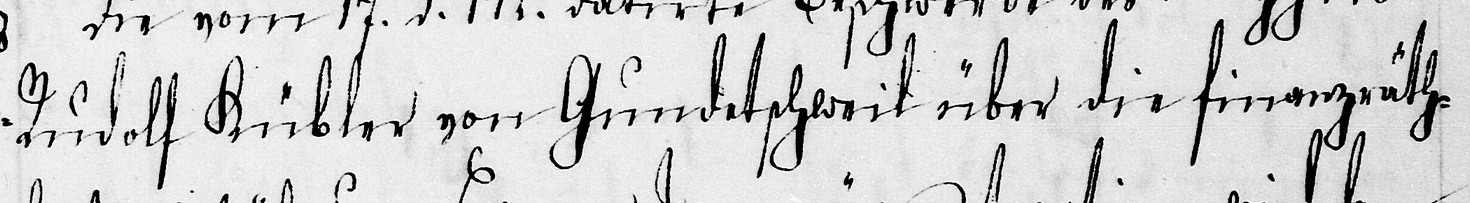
Rudolf Kübler von Gundetschweil über die finanzräth¬
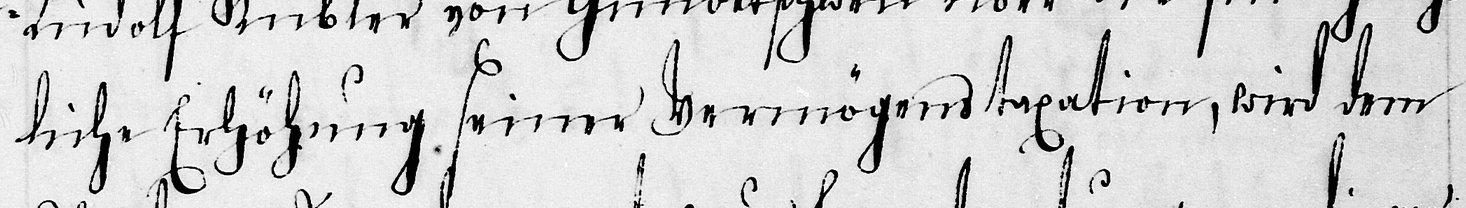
liche Erhöhung seiner Vermögenstaxation, wird dem
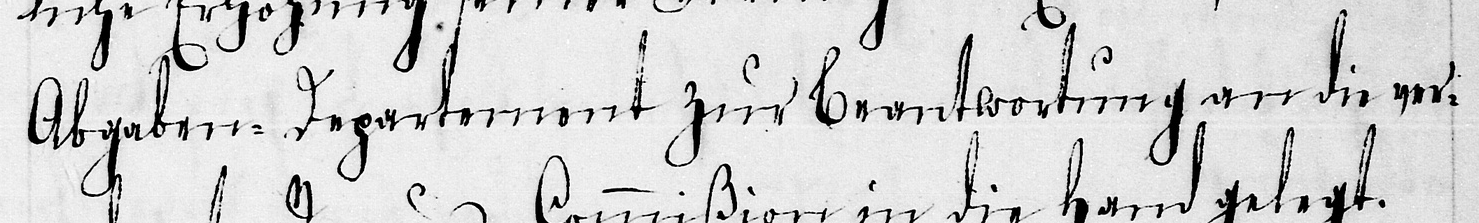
Abgaben-Departement zur Beantwortung an die ver¬
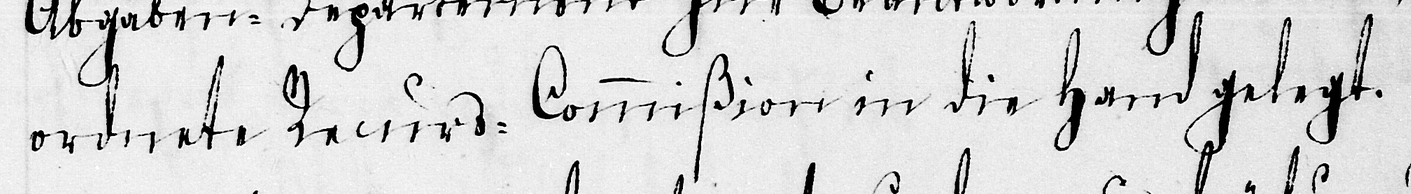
ordnete Recurs-Commißion in die Hand gelegt.
